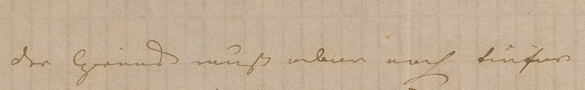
Der Grund muß aber noch tiefer
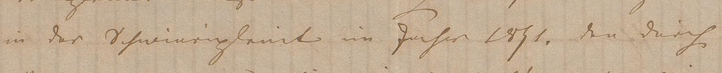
in der Schwierigkeit im Jahr 1851. den durch
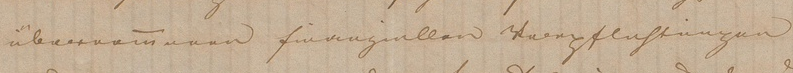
übernommenen finanziellen Verpflichtungen
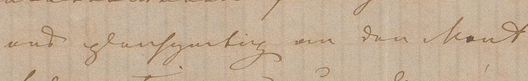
und gleichzeitig an den Mont
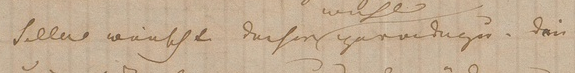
Sella wünscht daher wohl geradezu – den
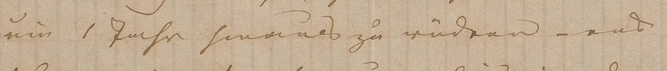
um 1 Jahr hinaus zu rüken – und
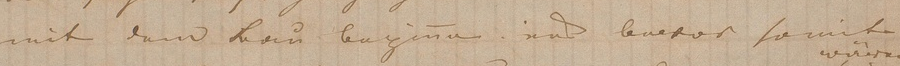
mit dem Bau beginnen – und bevor somit
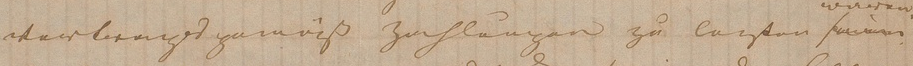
vertragsgemäß Zahlungen zu leisten seienwären
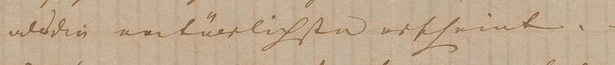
als die natürlichste erscheint. –
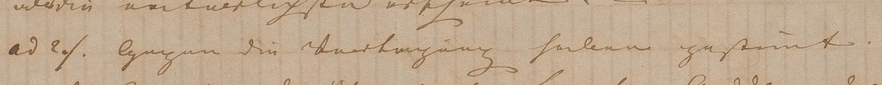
ad 2.) Gegen die Vertagung haben gestimmt –
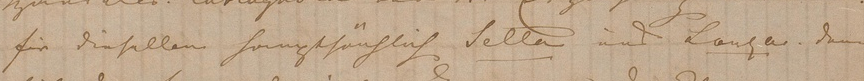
für dieselbe hauptsächlich Sella und Lanza – dem
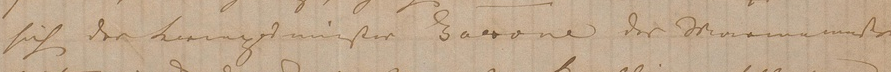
sich der Kriegsminister Garone der Marineminister
